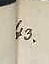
43.
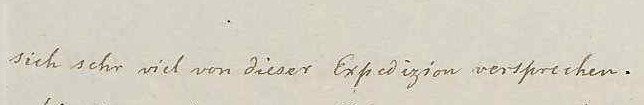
sich sehr viel von dieser Expedizion versprechen.
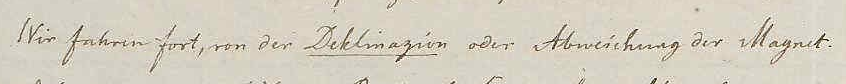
Wir fahren fort, von der Deklinazion oder Abweichung der Magnet-
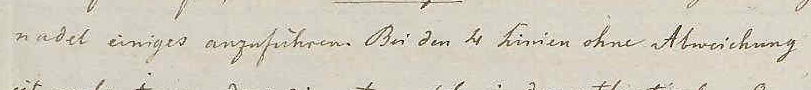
nadel einiges anzuführen. Bei den 4 Linien ohne Abweichung
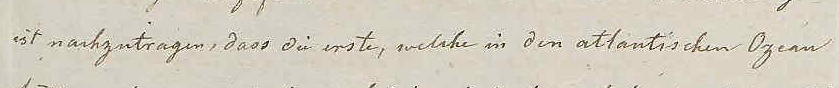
ist nachzutragen, dass die erste, welche in den atlantischen Ozean
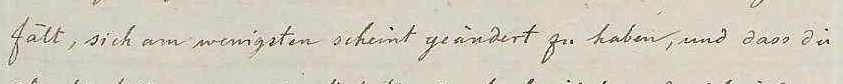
fält, sich am wenigsten scheint geändert zu haben, und dass die
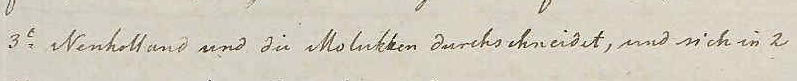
3￼ Neuholland und die Molukken durchschneidet, und sich in 2
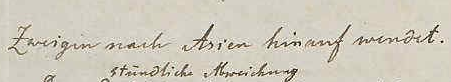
Zweigen nach Asien hinauf wendet.
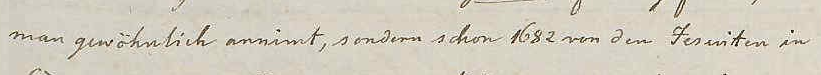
man gewöhnlich annimt, sondern schon 1682 von den Jesuiten in
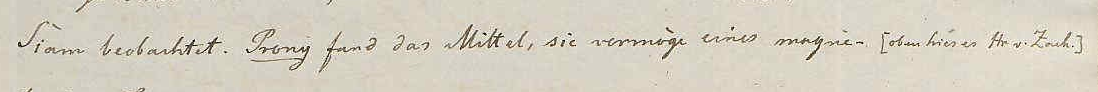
Siam beobachtet. Prony fand das Mittel, sie vermöge eines magne-
